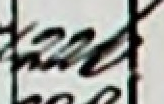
226
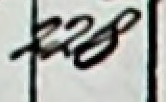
228
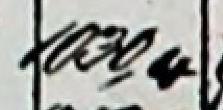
1030,4
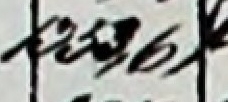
1353,6
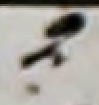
2
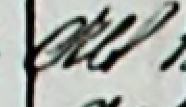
Alt
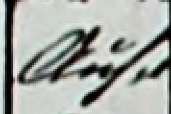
Aus„
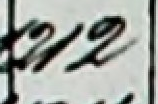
1212
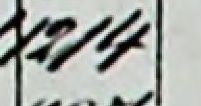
1214
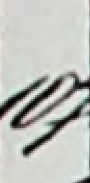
107
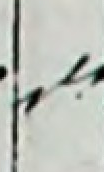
do
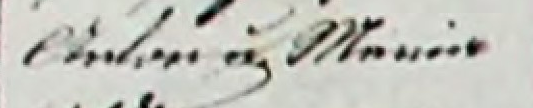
Anton u. Maria
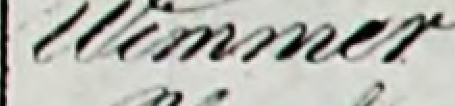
Wimmer
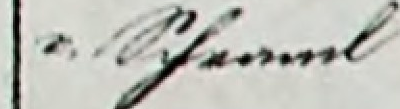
v. Schraml
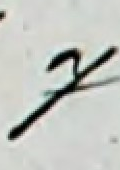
7
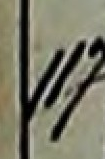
117
